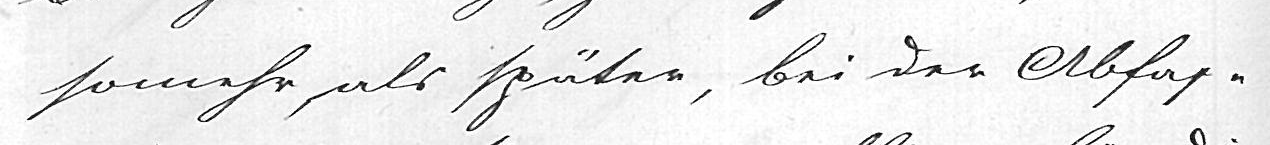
somehr, als später, bei der Abfas-
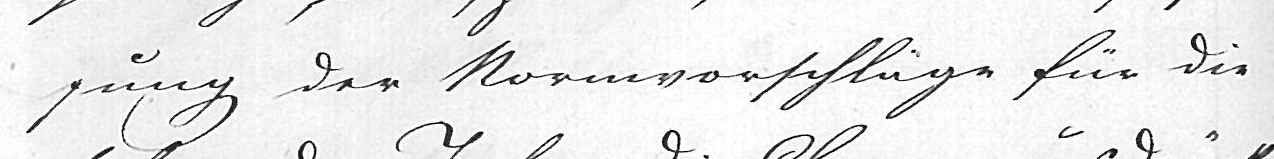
sung der Normvorschläge für die
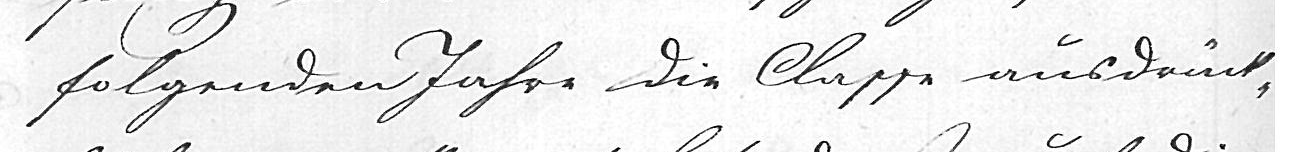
folgenden Jahre die Classe ausdrück-
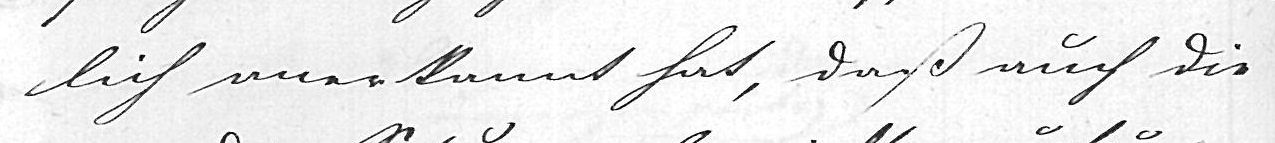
lich anerkannt hat, daß auch die
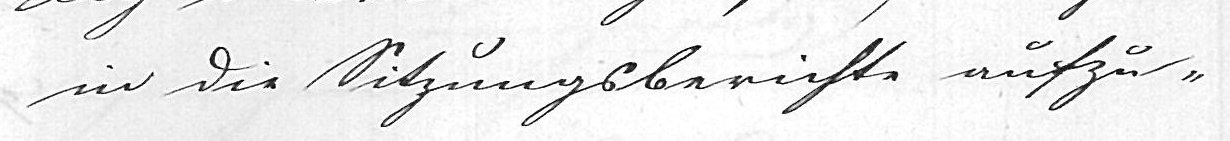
in die Sitzungsberichte aufzu-
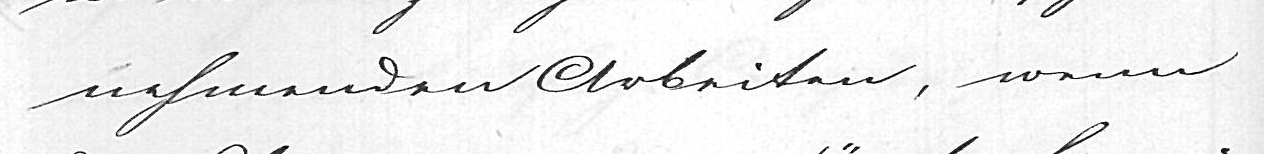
nehmenden Arbeiten, wenn
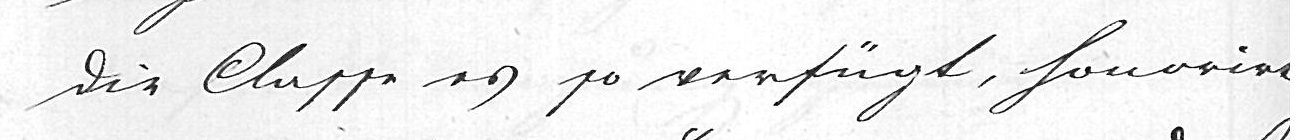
die Classe es so verfügt, honorirt
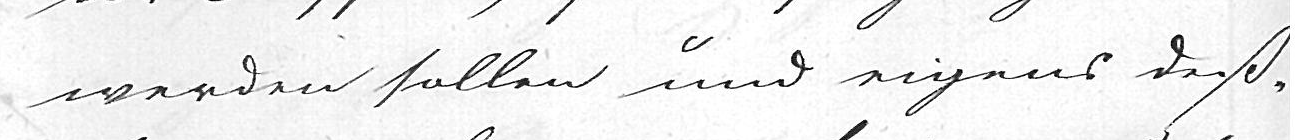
werden sollen und eigens deß-
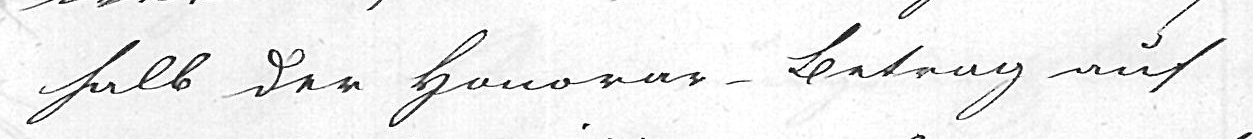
halb der Honorar-Betrag auf
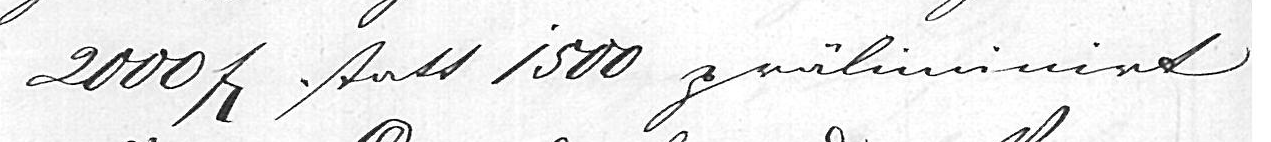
2000 fl statt 1500 präliminirt
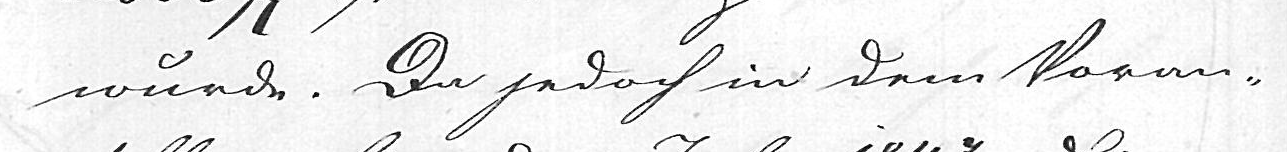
wurde. Da jedoch in dem Voran-
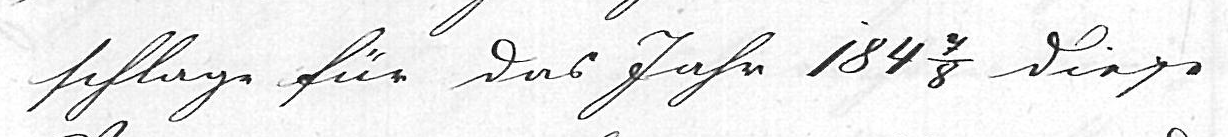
schlage für das Jahr 1847/8 diese
